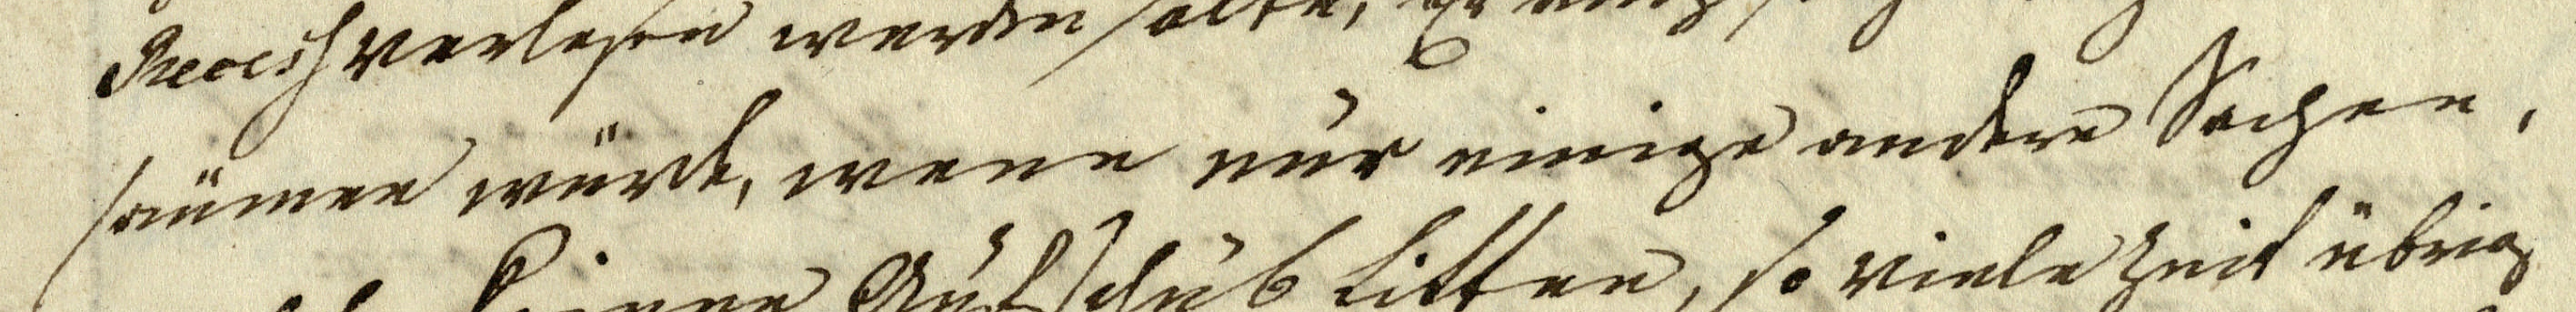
säumen würde, wenn nur einige andere Sachen,
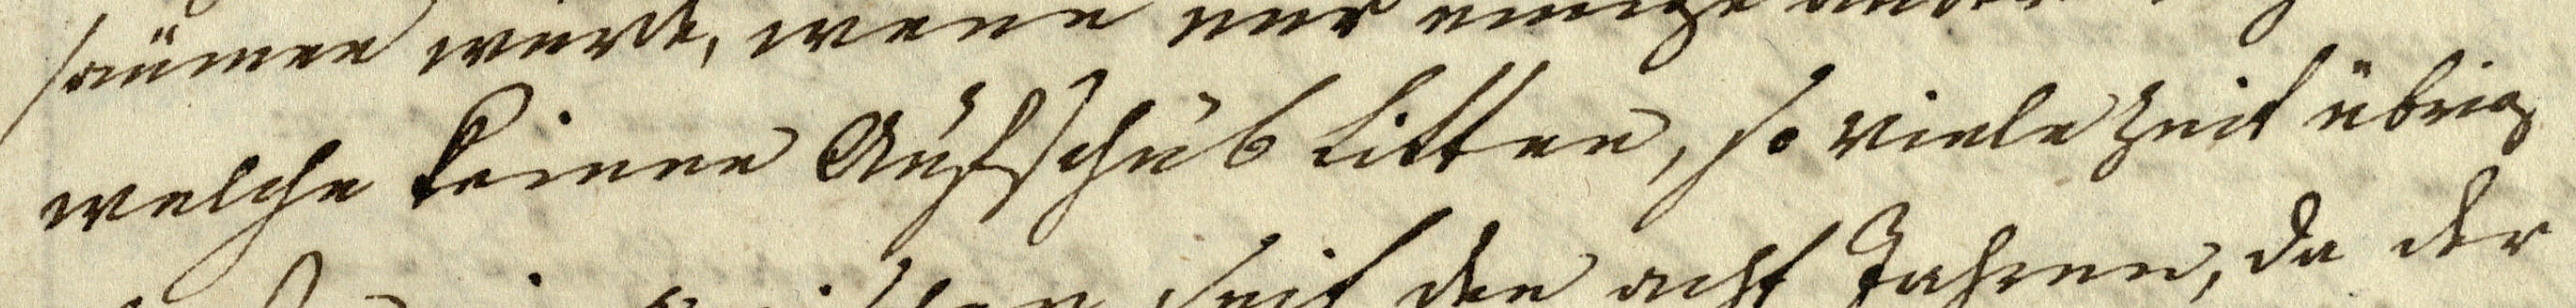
welche keinen Aufschub litten, so viele Zeit übrig
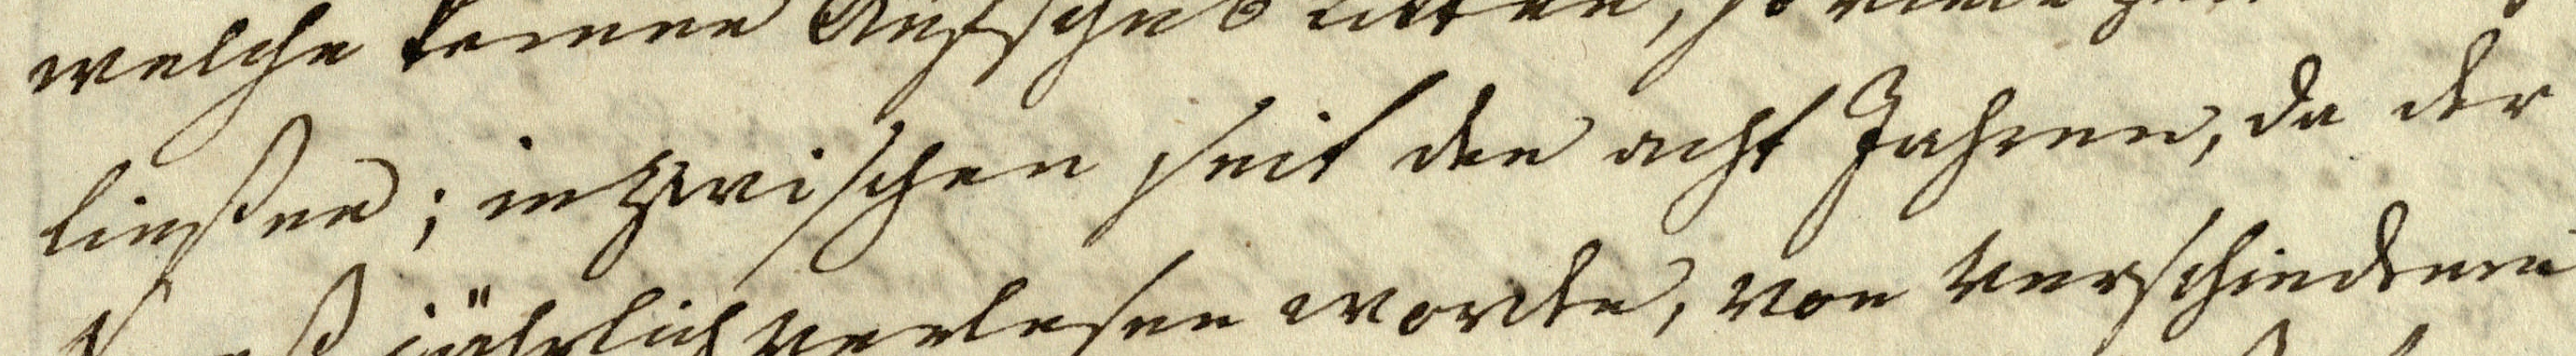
ließen; inzwischen seit den acht Jahren, da der
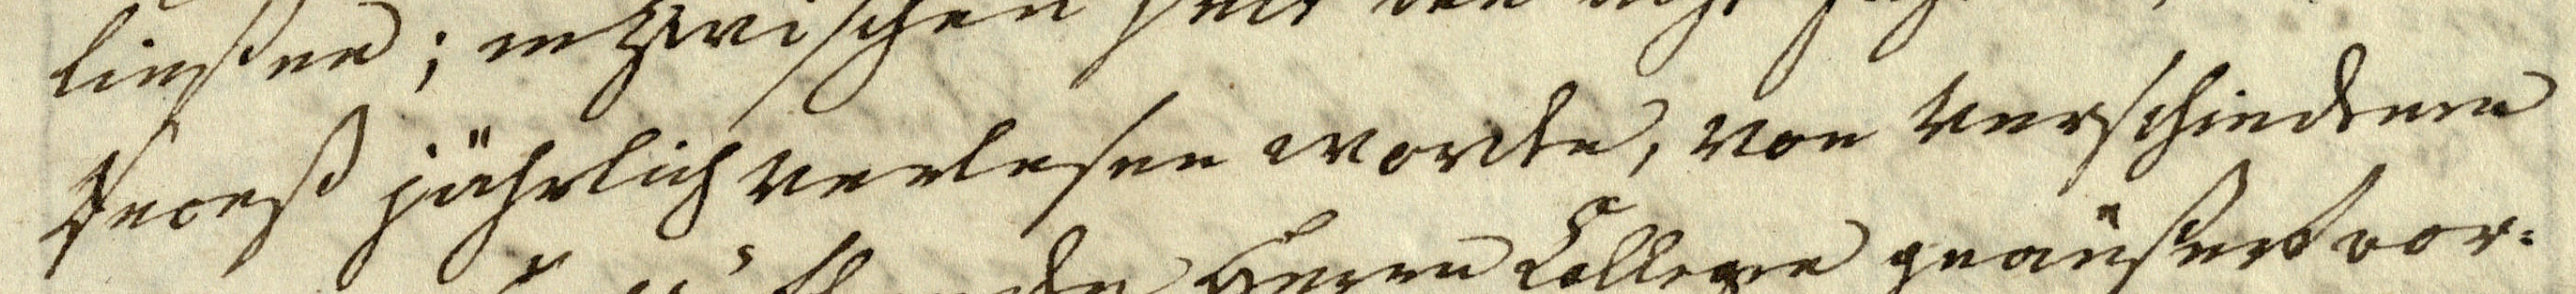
Receß jährlich verlesen worden, von verschiedenen
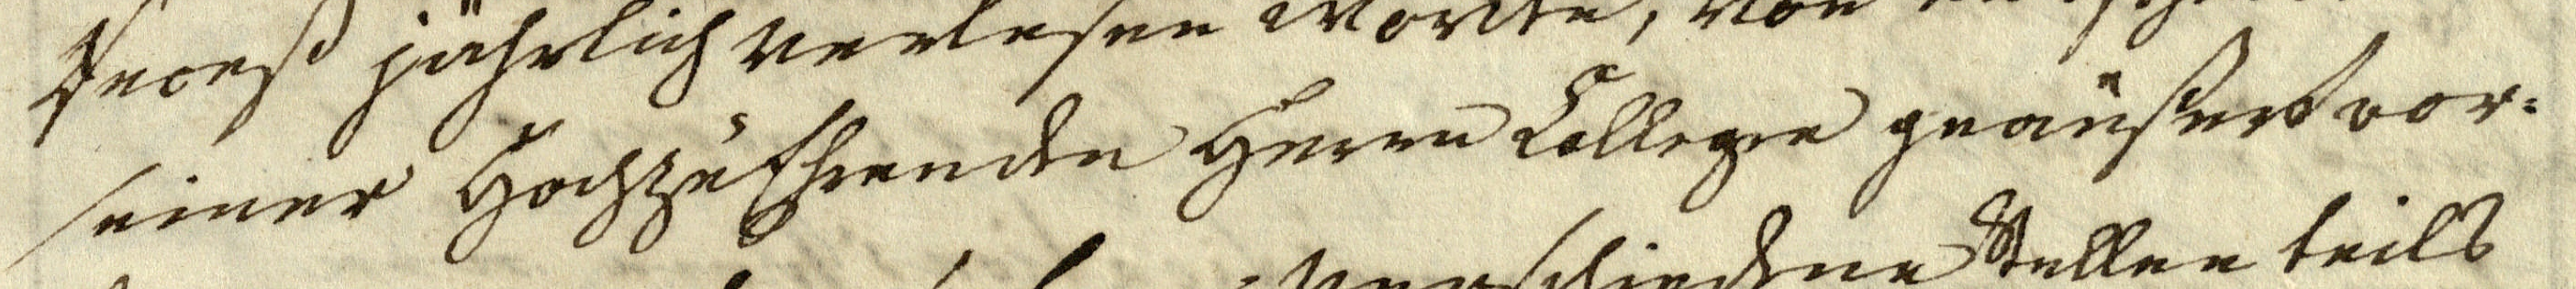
seiner HochzuEhrenden Herrn Collegen geäußert wor¬
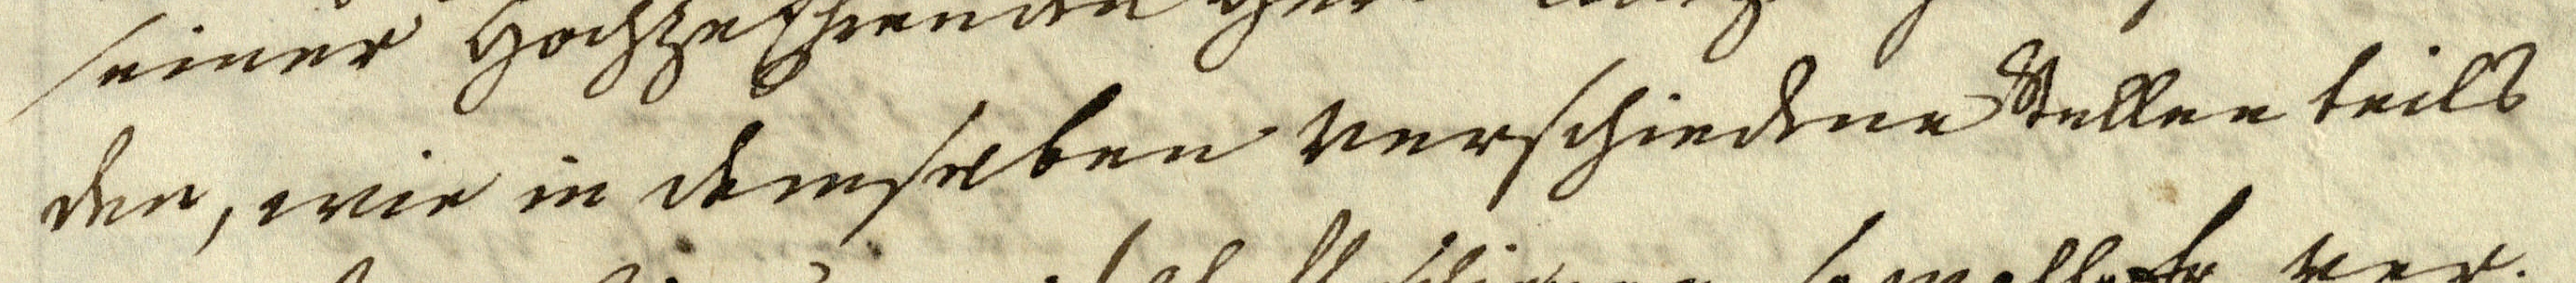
den, wie in demselben verschiedene Stellen teils
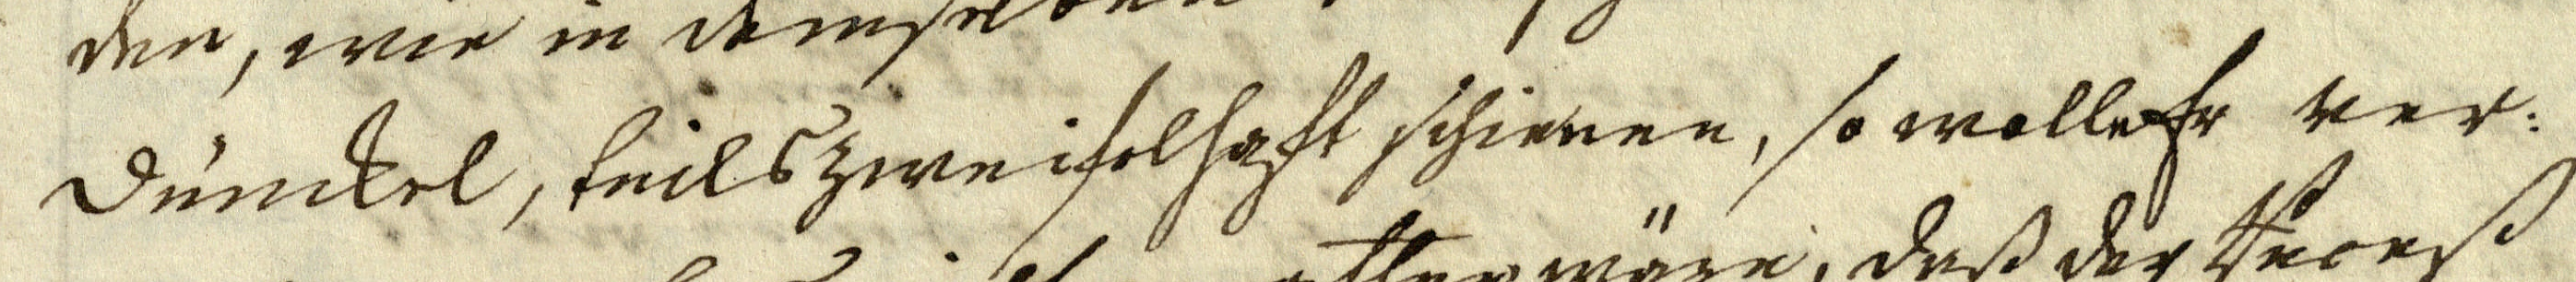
dunckel, teils zweifelhaft schienen, so wolle Er ver¬
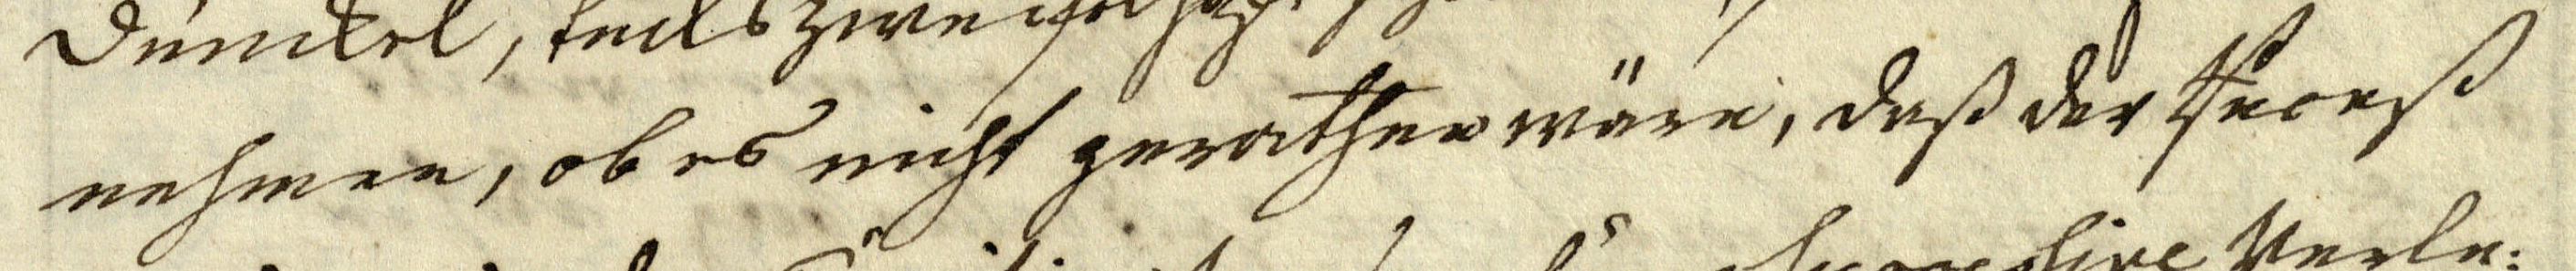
nehmen, ob es nicht gerathen wäre, daß der Receß
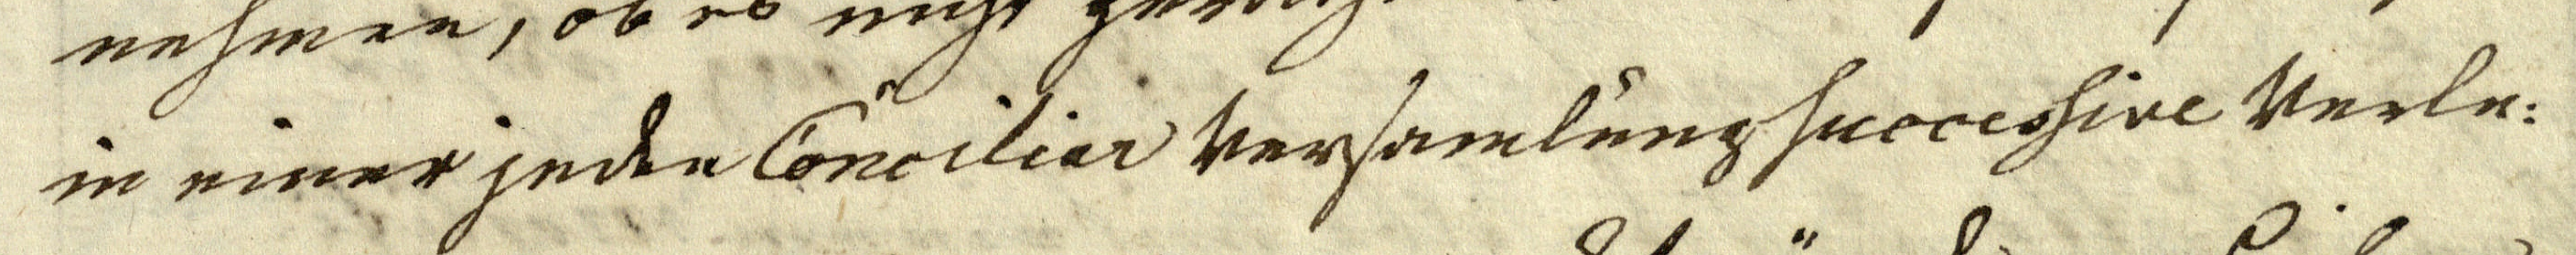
in einer jeden Conciliar Versamlung successive verle¬
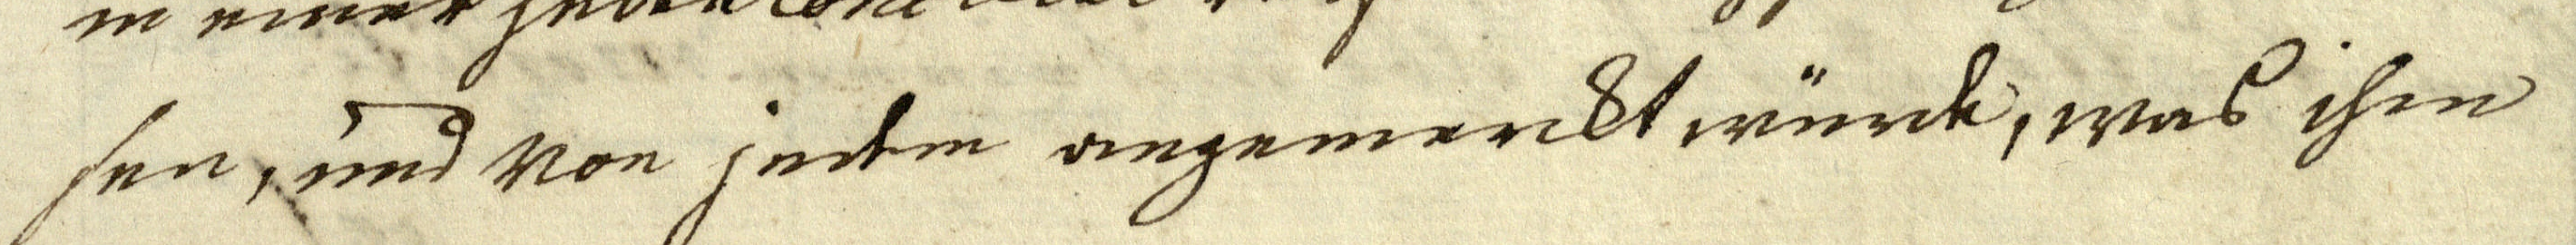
sen, und von jedem angemerckt würde, was ihm
